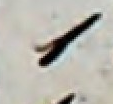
1
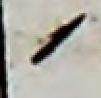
1
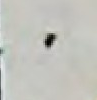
„
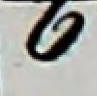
6
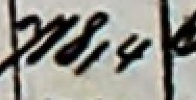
?18,4
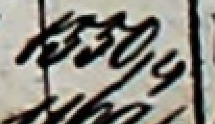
1550,4
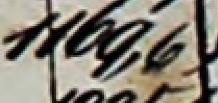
1169,6
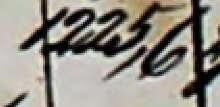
1225,6
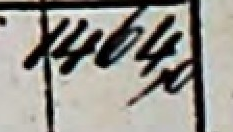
1464,0
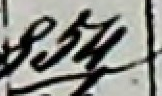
854
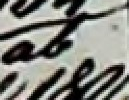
ab
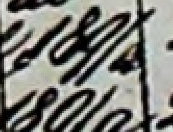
189/a
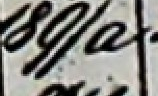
189/a
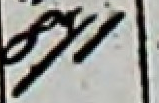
871
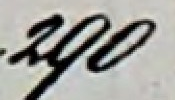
290
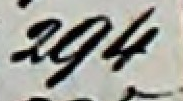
294
